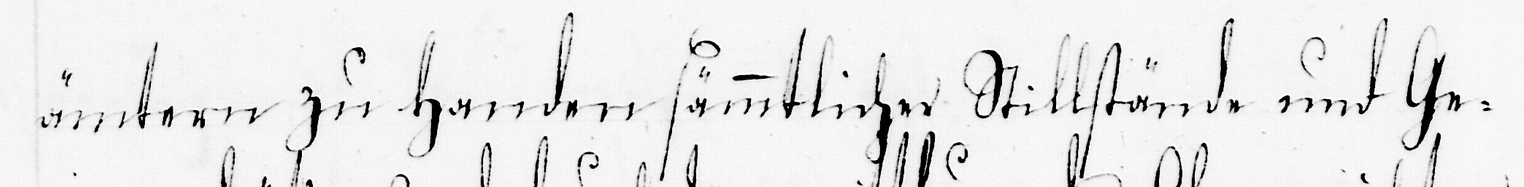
ämtern zu Handen sämmtlicher Stillstände und Ge¬
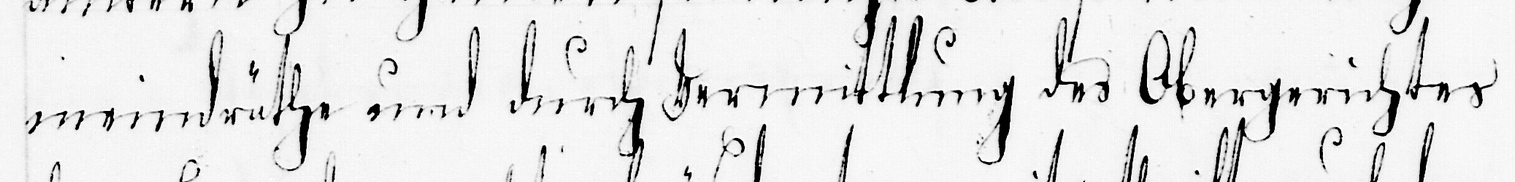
meindräthe und durch Vermittlung des Obergerichtes
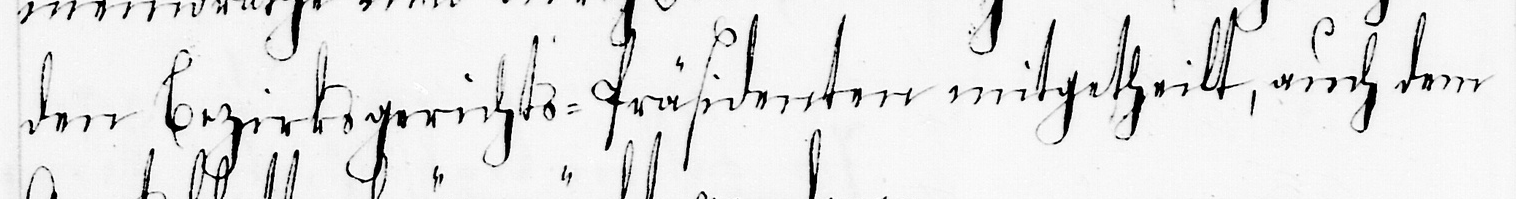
den Bezirksgerichts-Präsidenten mitgetheilt, auch dem
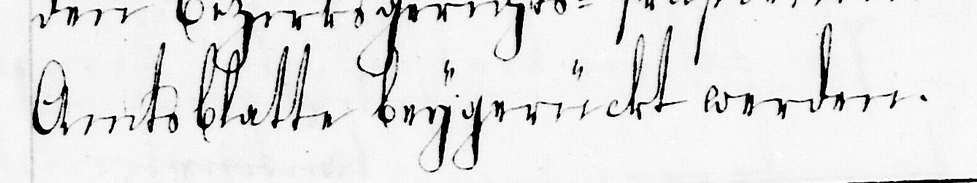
Amtsblatte beygerückt werden.
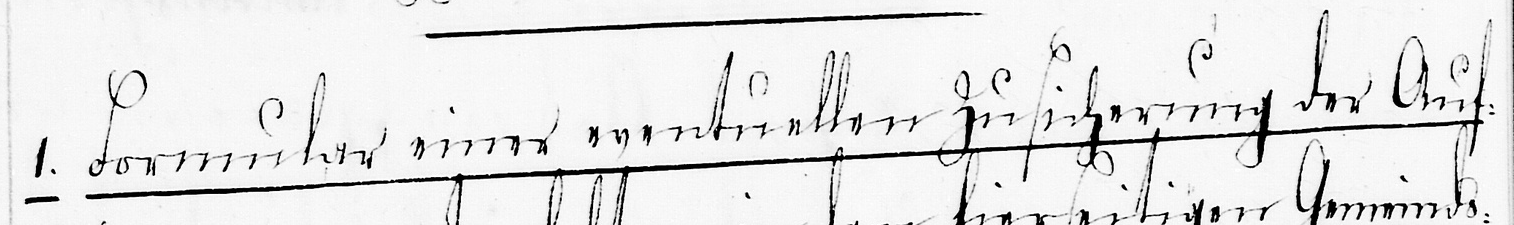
I. Formular einer eventuellen Zusicherung der Auf¬
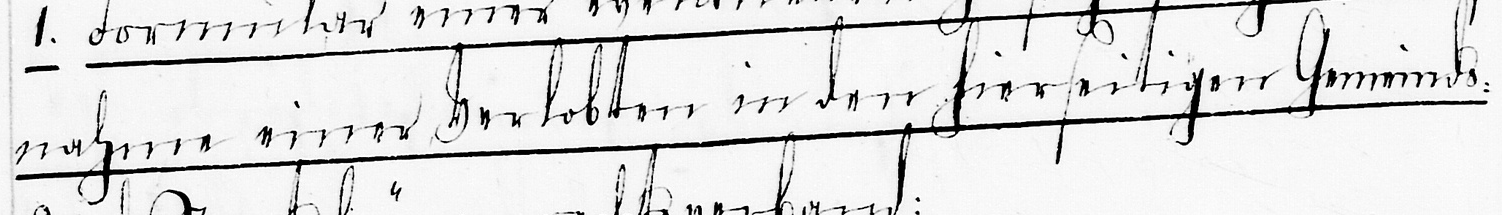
nahme einer Verlobten in den hierseitigen Gemeinds-
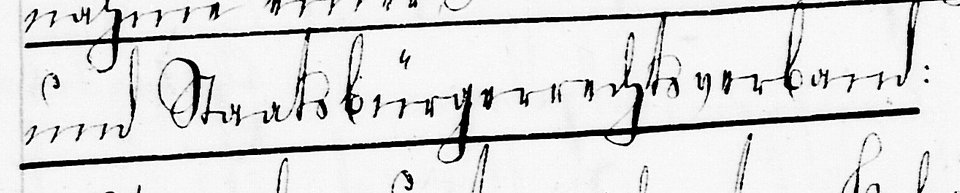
und Staatsbürgerrechtsverband:
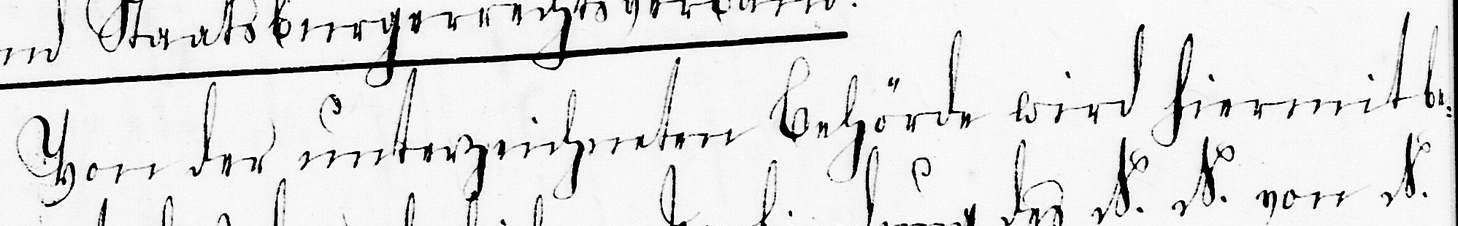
Von der unterzeichneten Behörde wird hiermit b¬
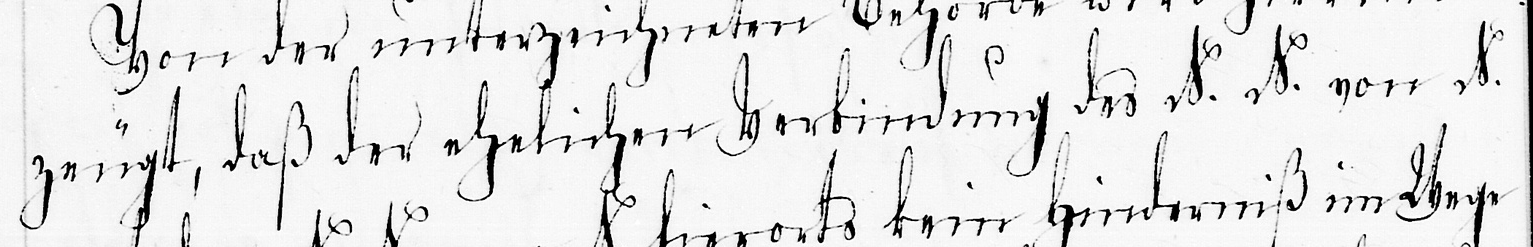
ezeugt, daß der ehelichen Verbindung des N. N. von N.
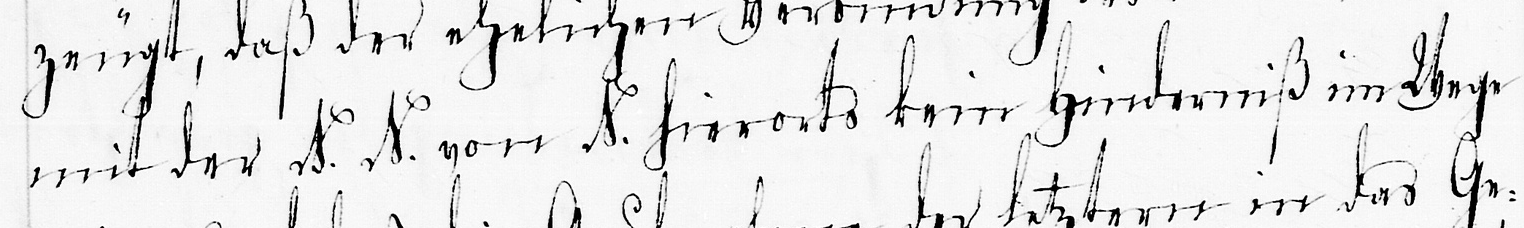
mit der N. N. von N. hierorts kein Hinderniß im Wege
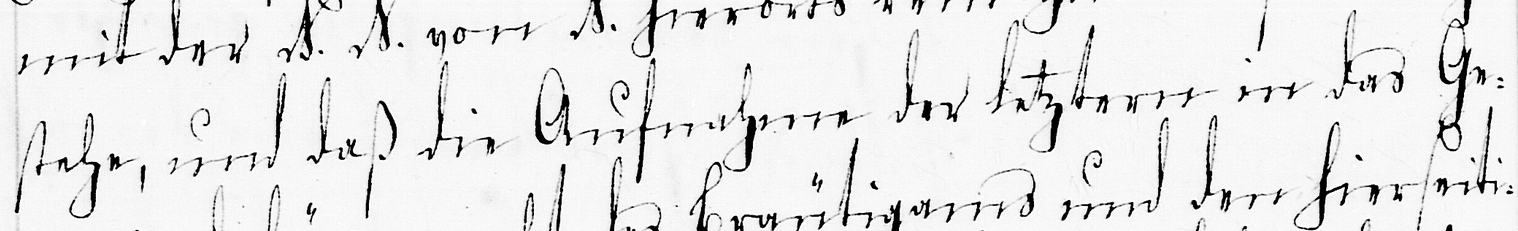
stehe, und daß die Aufnahme der letztern in das Ge¬
